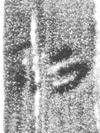身
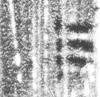者
